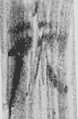亓（其）
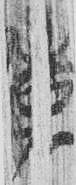疆
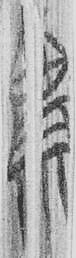○（鬼）
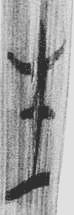生
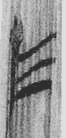於
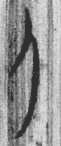人
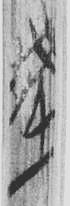○（吾）
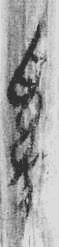○（奚）
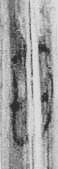古（故）
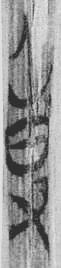事
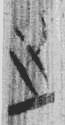之
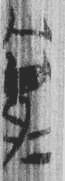骨
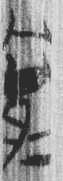肉
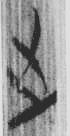之
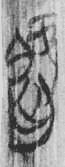既
